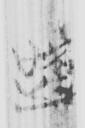{足欠}
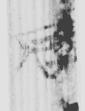君
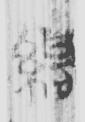紿
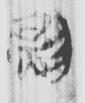則
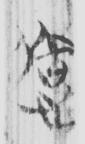{人缶心}
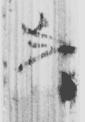之
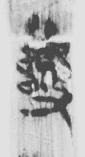𠧏（亂）
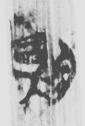則
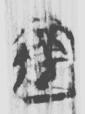{止達}
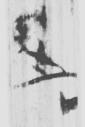之
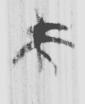夫
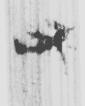又
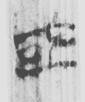或
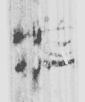必
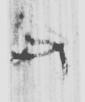又
